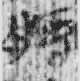痀
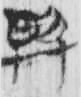與
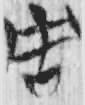周
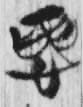惃
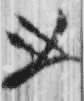之
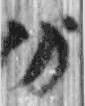分
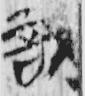○（察）
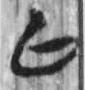㠯（以）
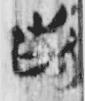○（廷）
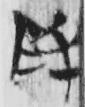阩
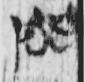門
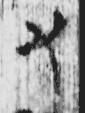又
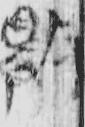敗
